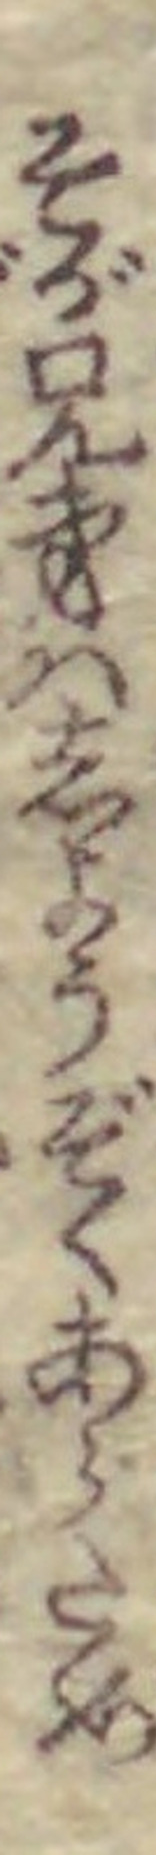そが兄弟はしようぞくあらため
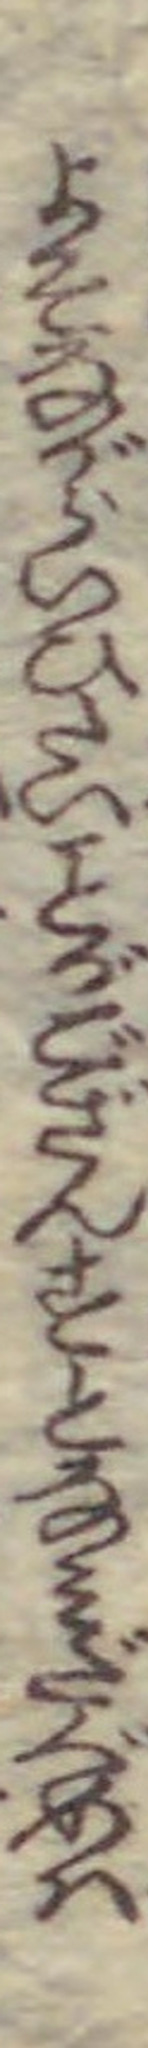よそながらいひたいことがござんすとなみだぐめば
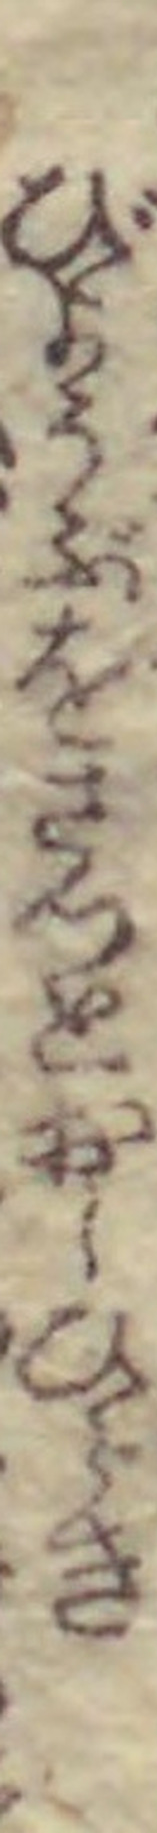びようぶをさつとおしひらき
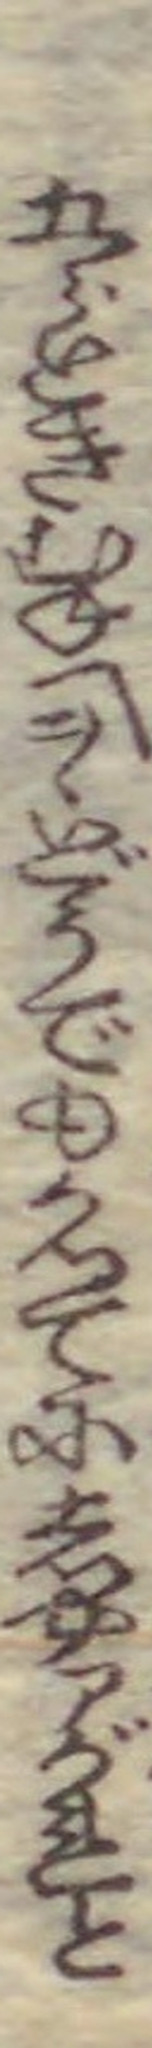五郎ときむね〽ヲヽどうでもかつてにしやァがれと
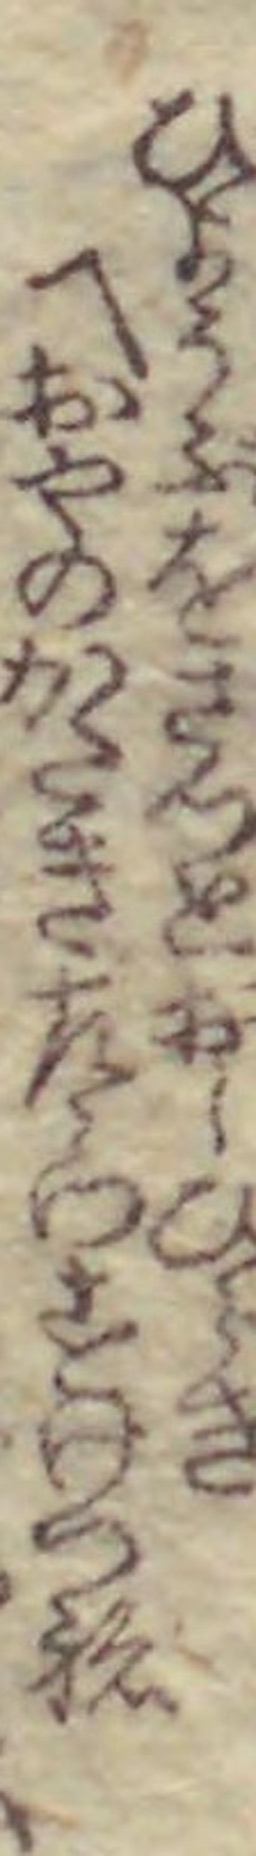〽おやのかたき左衛門すけつね
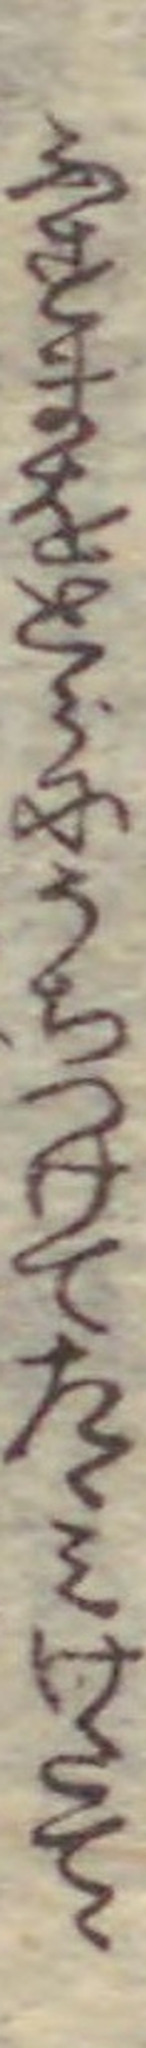ふすまをとらにうちつけてたゝみけたてゝ
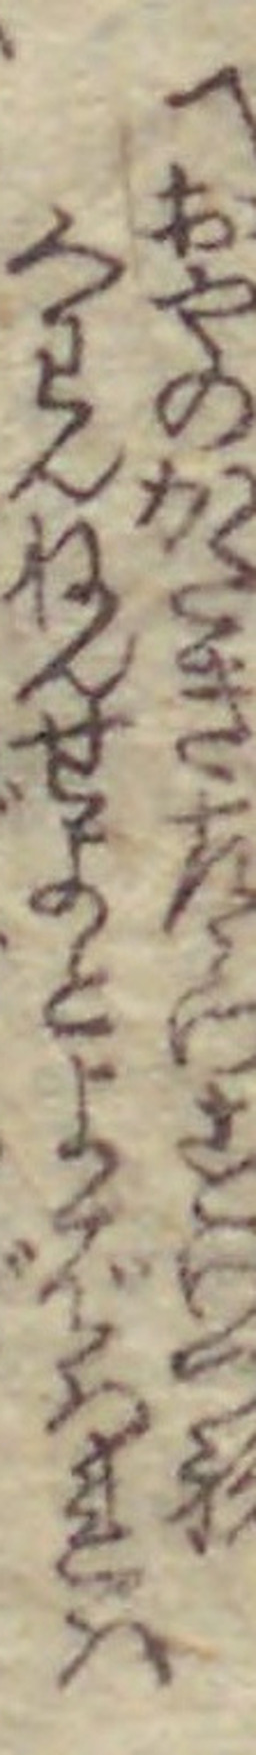くわんねんせよとよばはれは
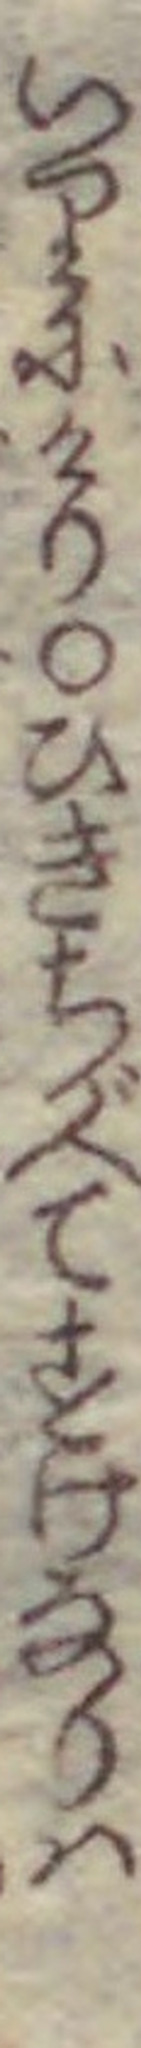いりにけり○ひきちがへてすけなりは
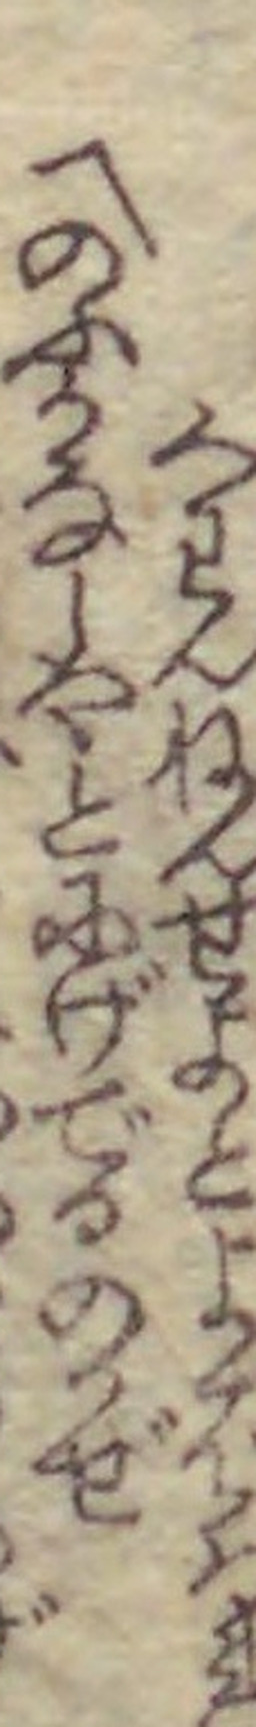〽のふかなしやとにげでるのかぜ
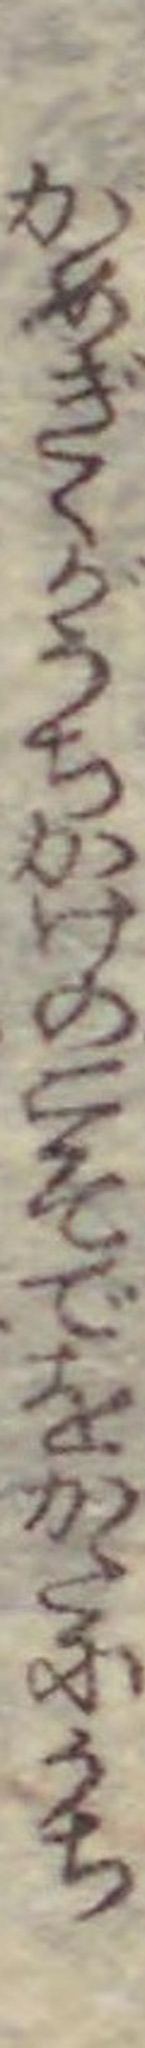かめぎくがうちかけのこそでをかたにうち
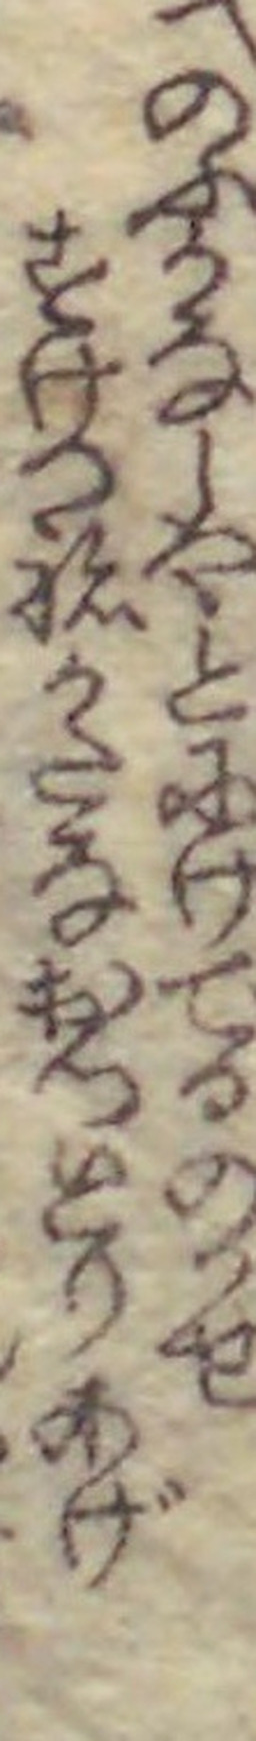すけつねかたなおつとりあげ
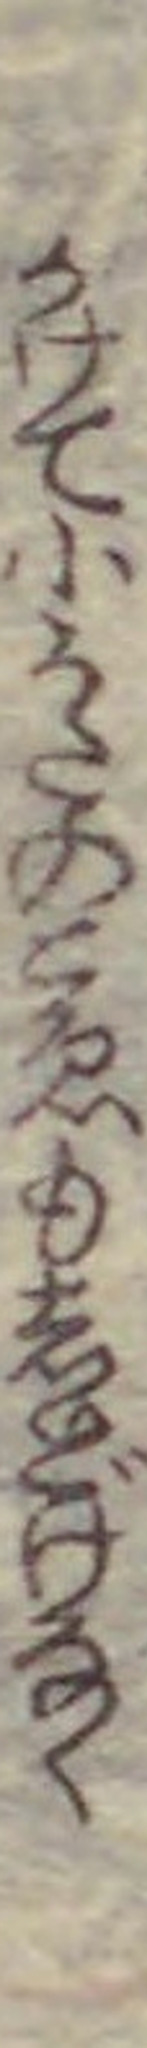かけて小うたのこゑもしどけなく
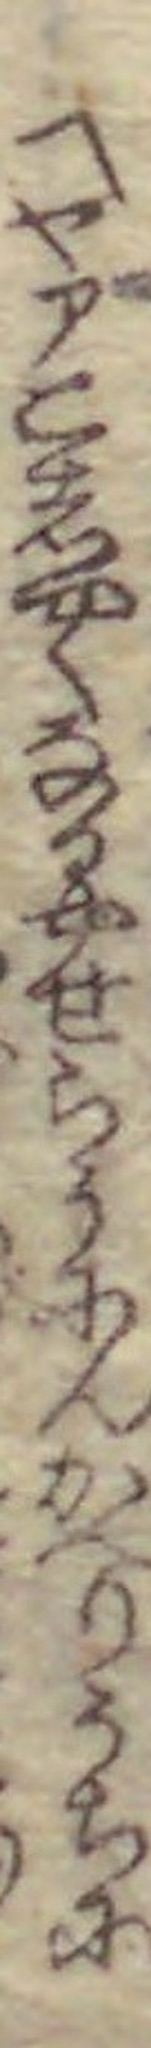〽ヤアこしやくなるやせらうにんかへりうちに
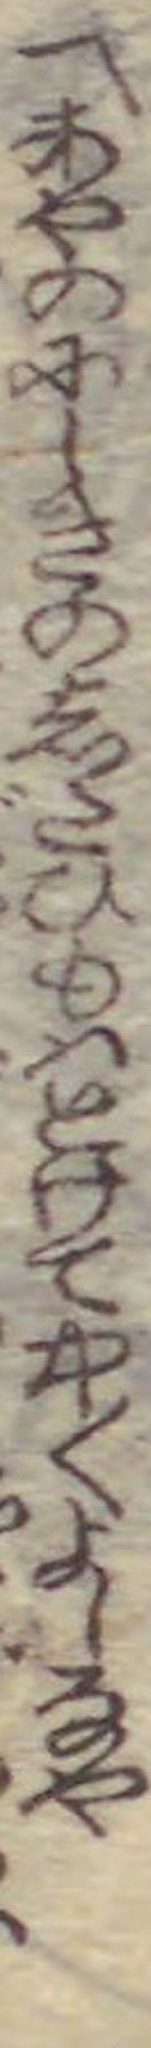〽あやのにしきのしたひもはとけて中〳〵よしなるや
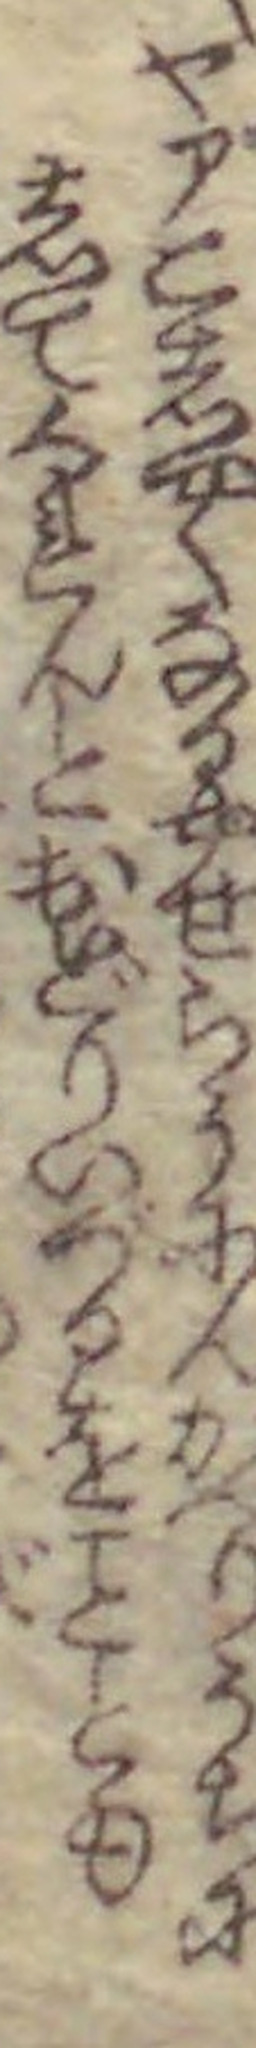してくれんとおどりいづるをこととも
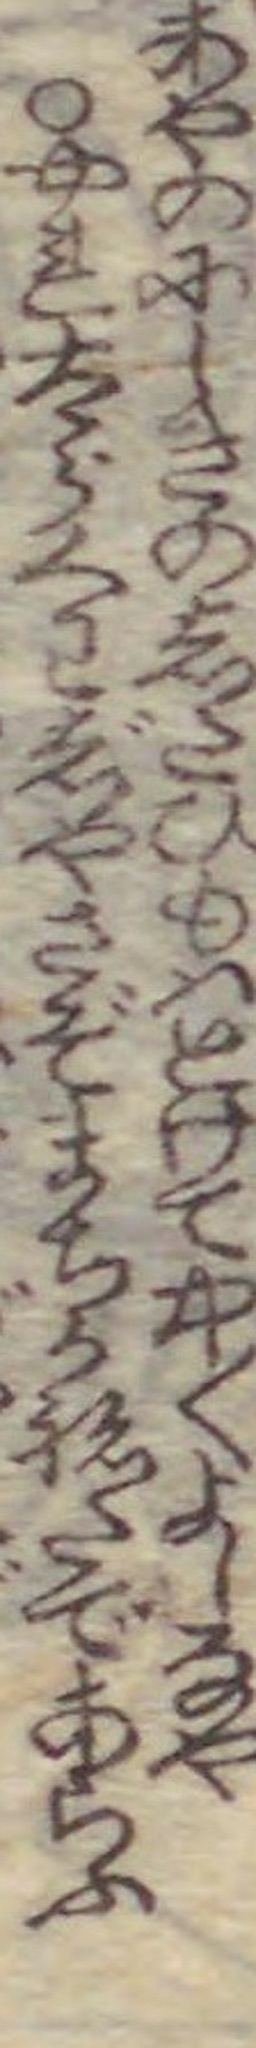○やれ太郎くわじやさぞまちかねたであらふ
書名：大時代唐土化物 3巻. 曽我太夫染
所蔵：国立国会図書館 National Diet Library, JAPAN
